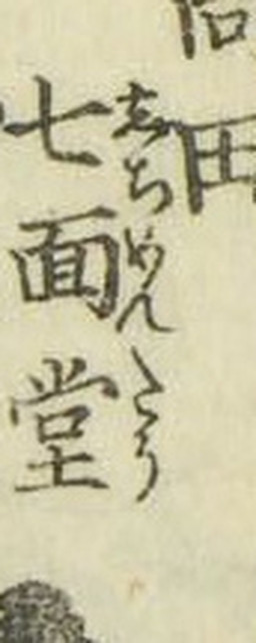七面堂
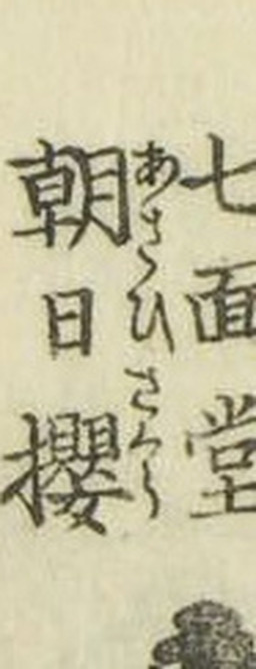朝日櫻
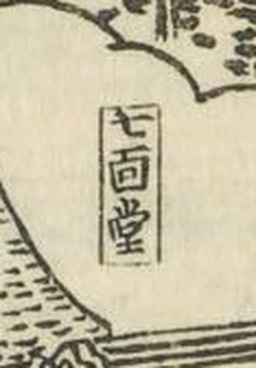七面堂

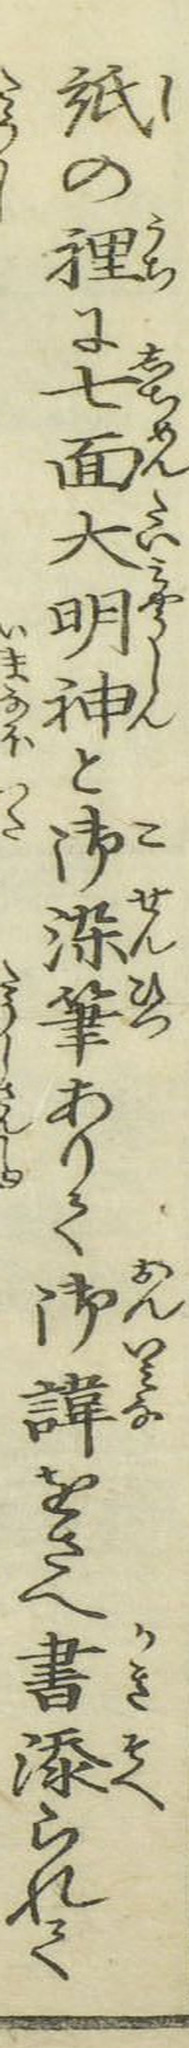紙の裡に七面大明神と御染筆ありて御諱をさへ書添られて
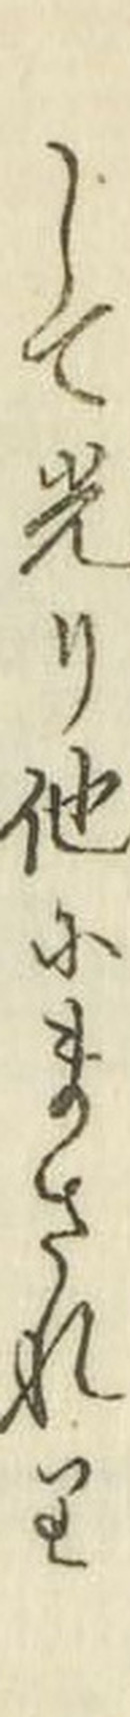して光り他にまされり
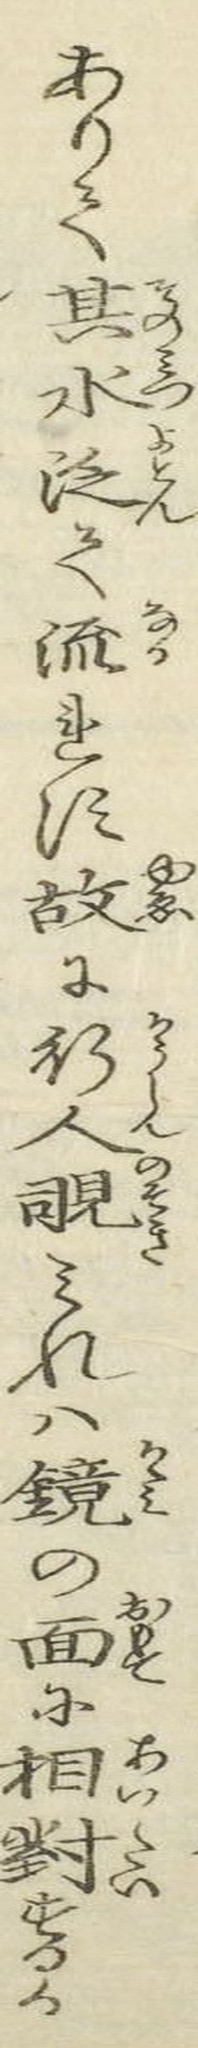ありて其水泛て流れす故に行人覗みれは鏡の面に相對するか
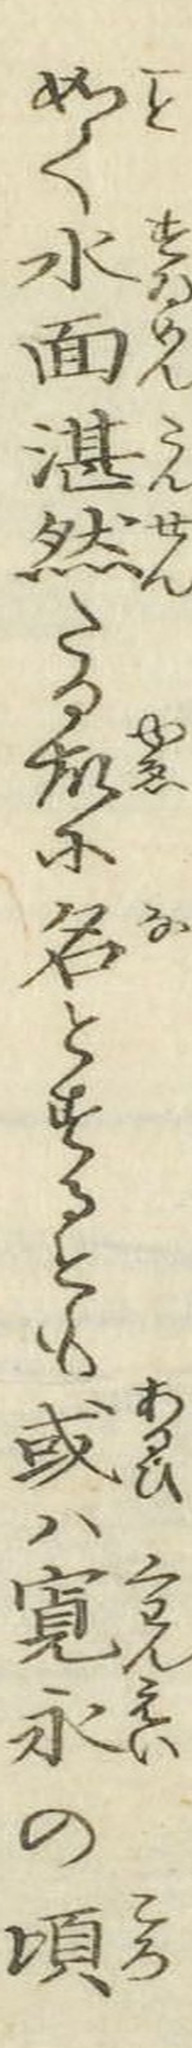如く水面湛然たる故に名とするとも或は寛永の頃
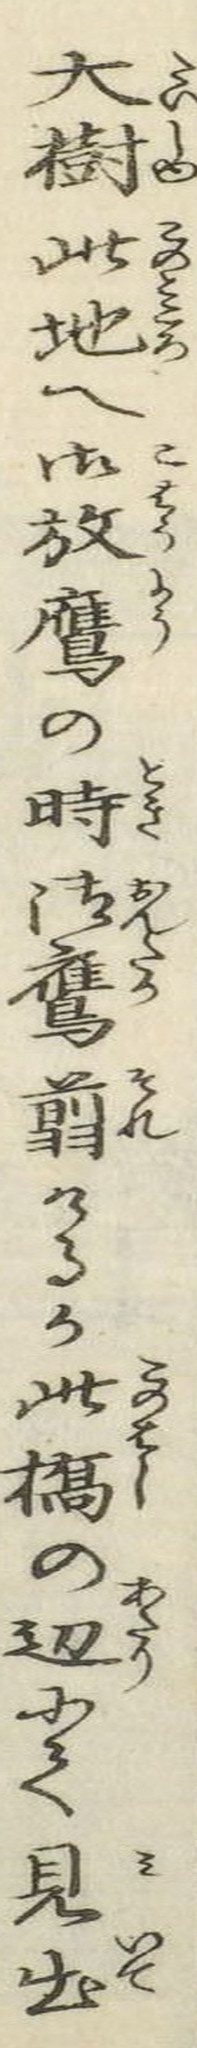大樹此地へ御放鷹の時御鷹翦けるか此橋の辺にて見出
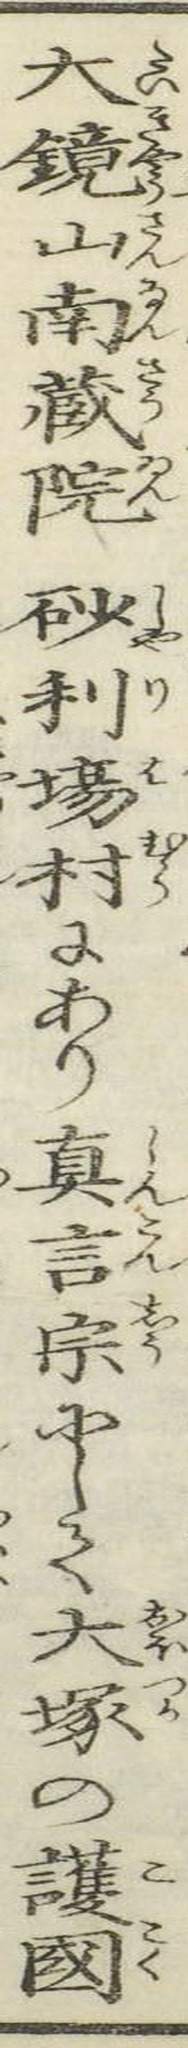大鏡山南藏院砂利塲村にあり真言宗にして大塚の護國
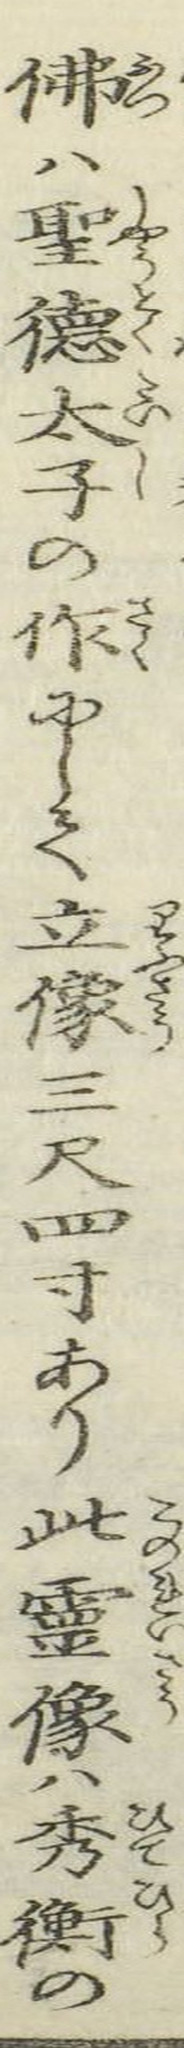佛は聖徳太子の作にして立像三尺四寸あり此霊像は秀衡の
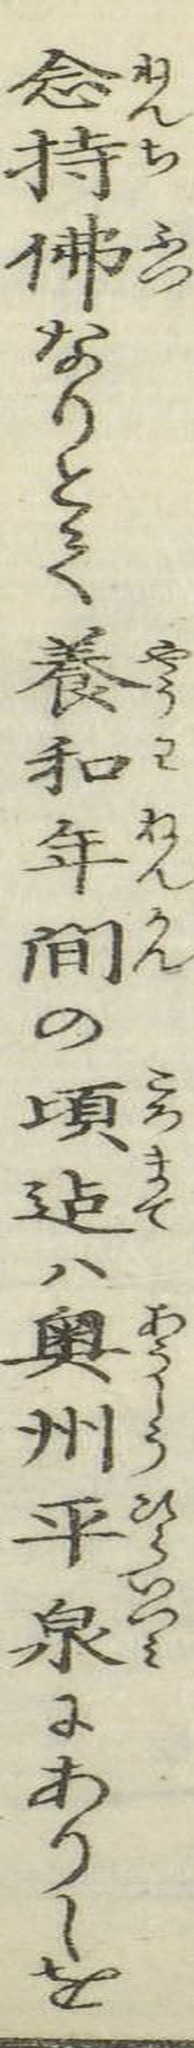念持佛なりとて養和年間の頃迠は奥州平泉にありしを
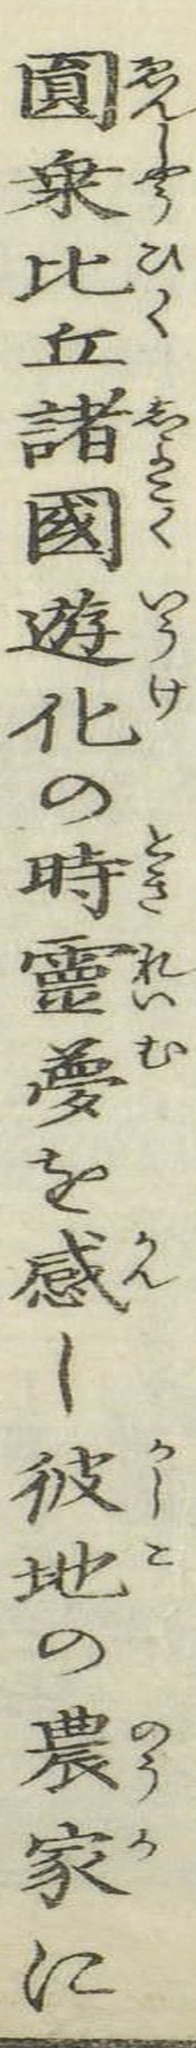圓乗比丘諸國遊化の時霊夢を感し彼地の農家に
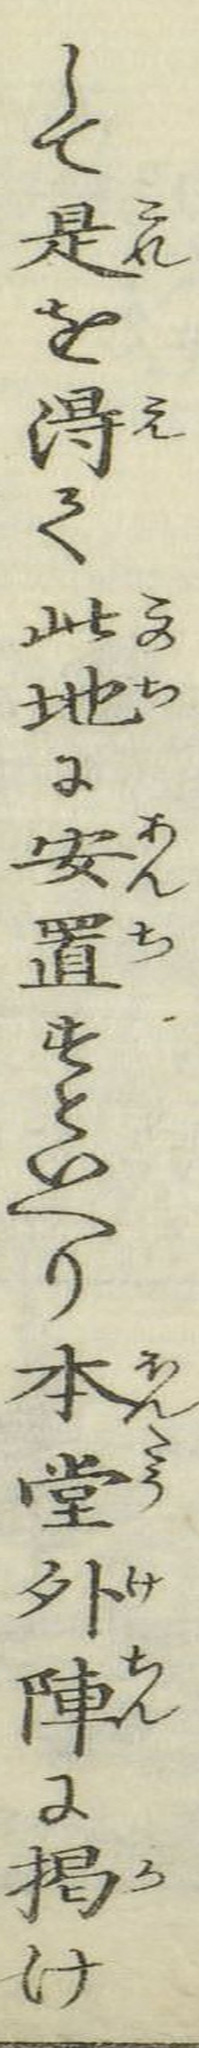して是を得て此地に安置すといへり本堂外陣に掲け
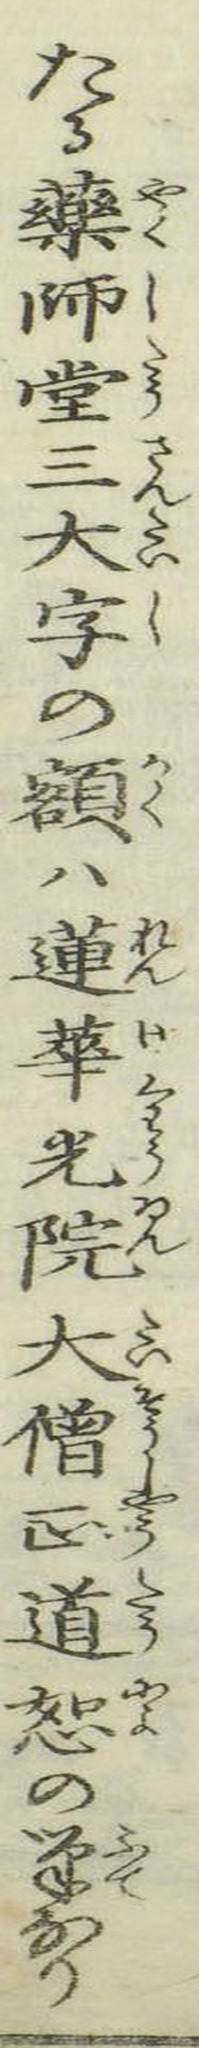たる藥師堂三大字の額は蓮華光院大僧正道恕の筆なり
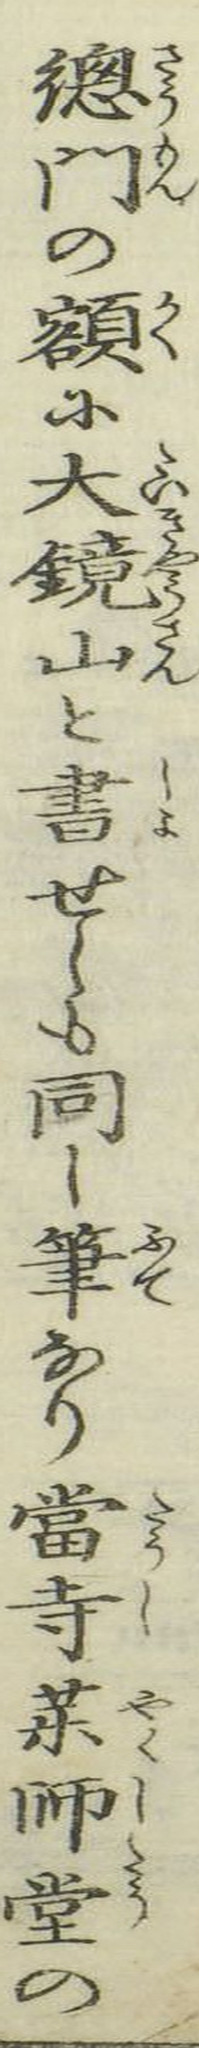緫門の額に大鏡山と書せしも同し筆なり當寺薬師堂の

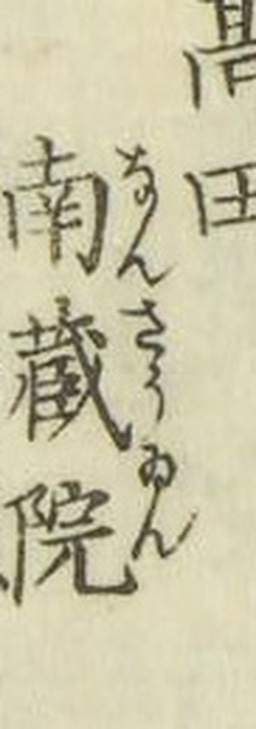南蔵院
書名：江戸名所図会 20巻 巻之12
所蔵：東京学芸大学教育コンテンツアーカイブ
